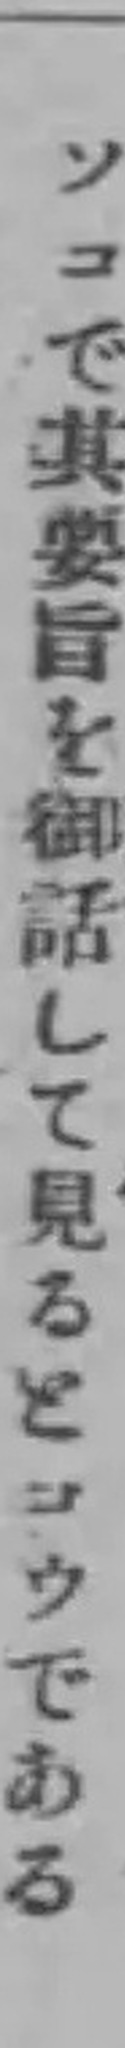ソコで其要旨を御話して見るとコウである
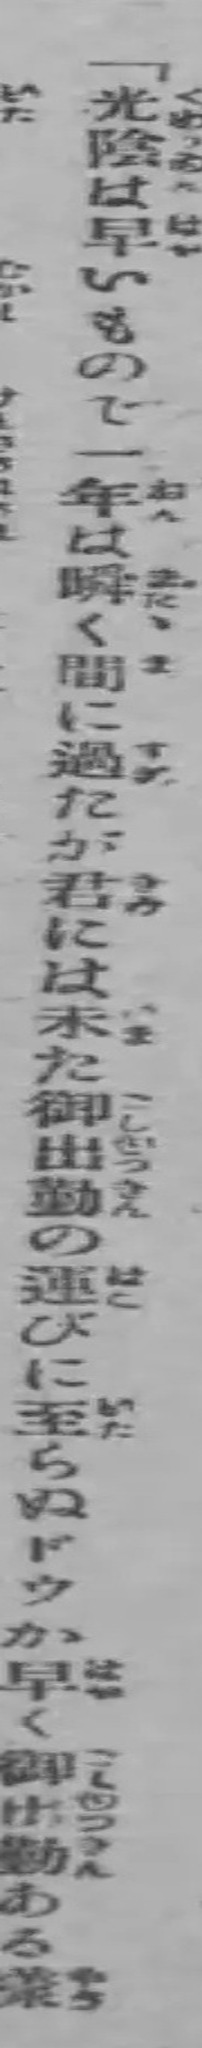「光陰は早いもので一年は瞬く間に過たが君には未だ御出勤の運びに至らぬドウか早く御出勤ある様
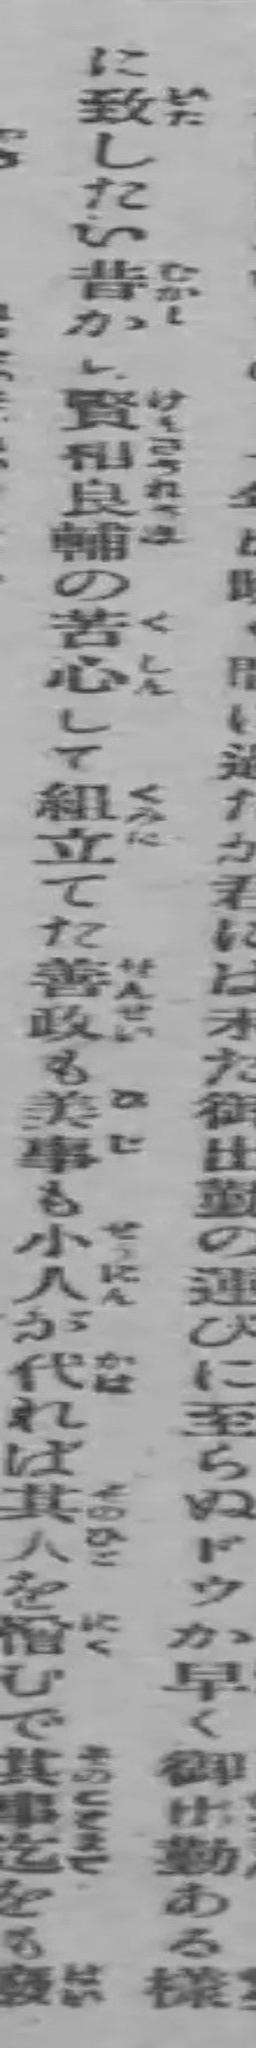に致したい昔から賢相良輔の苦心して組立てた善政も美事も小人が代れば其人を憎むで其事迄をも廃
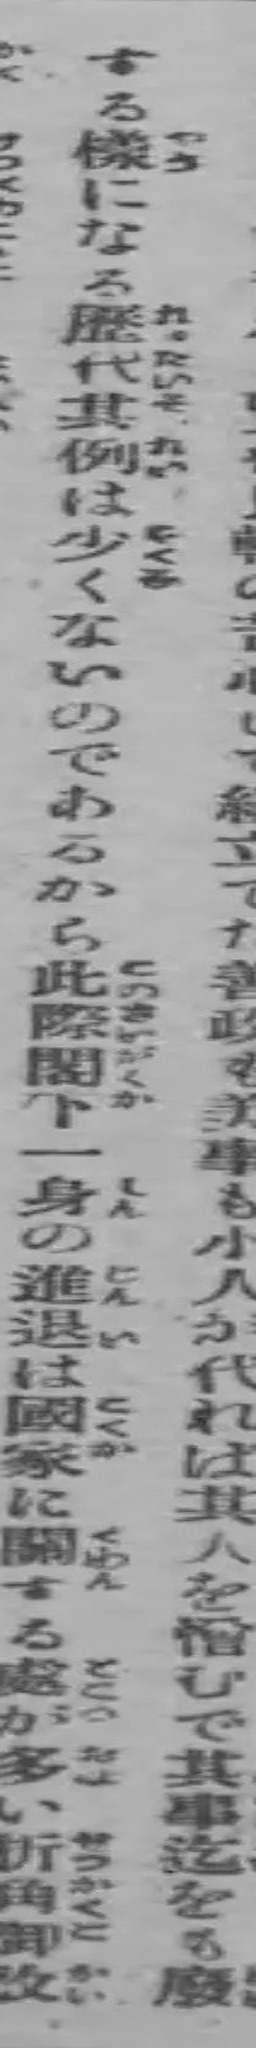する様になる歴代其例は少くないのであるから此際閣下一身の進退は国家に関する処が多い折角御改
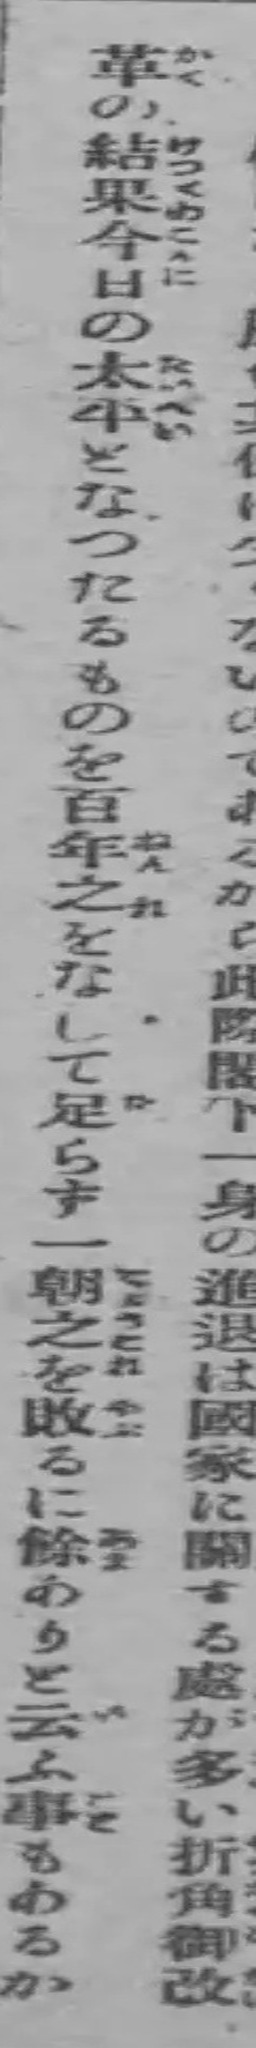革の結果今日の太平となつたるものを百年之をなして足らず一朝之を敗るに余ありと云ふ事もあるか
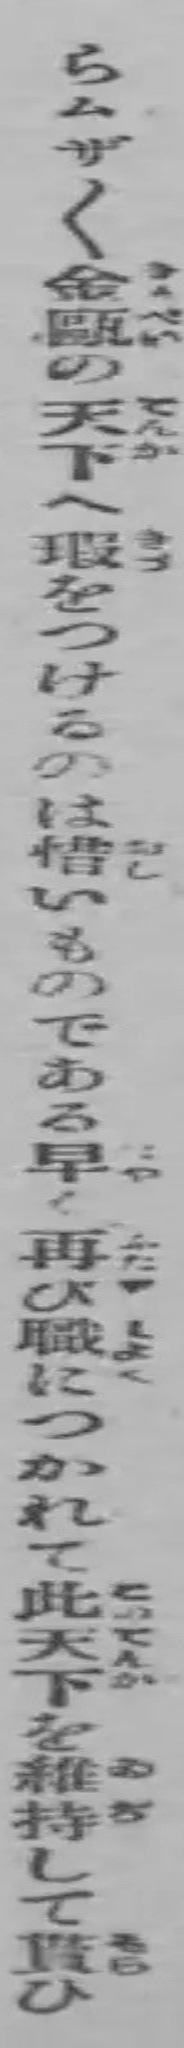らムザ〳〵金甌の天下へ瑕をつけるのは惜いものである早く再び職につかれて此天下を維持して貰ひ
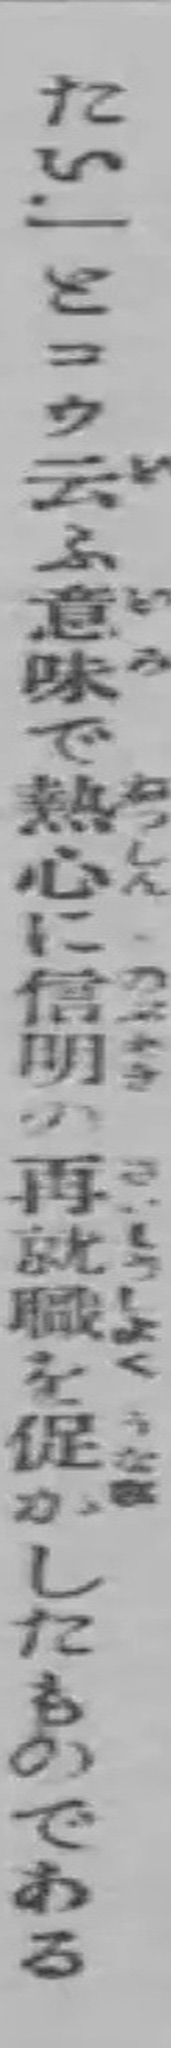たい」とコウ云ふ意味で熱心に信明の再就職を促したものである
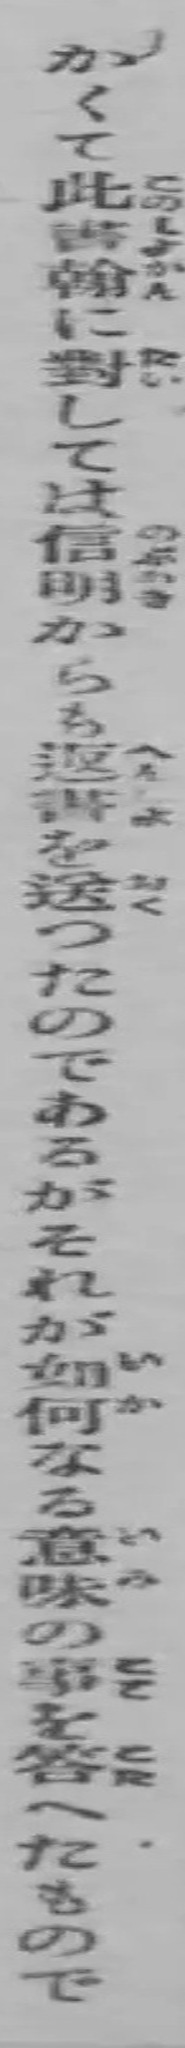かくて此書翰に対しては信明からも返書を送つたのであるがそれが如何なる意味の事を答へたもので
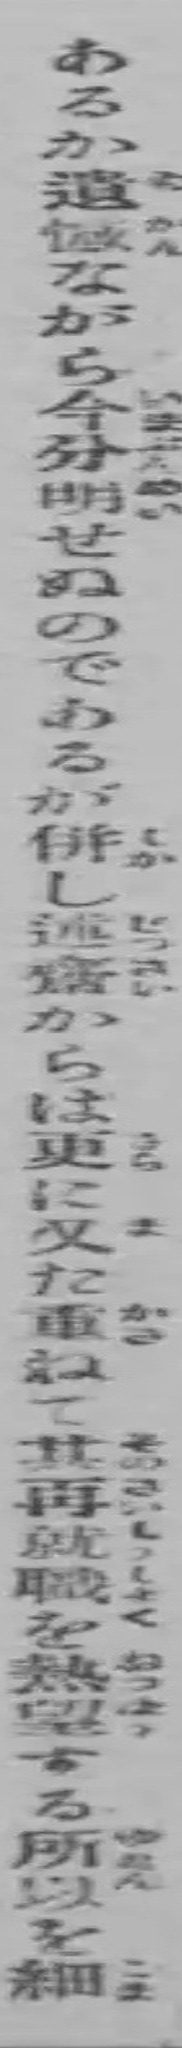あるか遺憾ながら今分明せぬのである併し述斉からは更に又た重ねて其再就職を熱望する所以を細
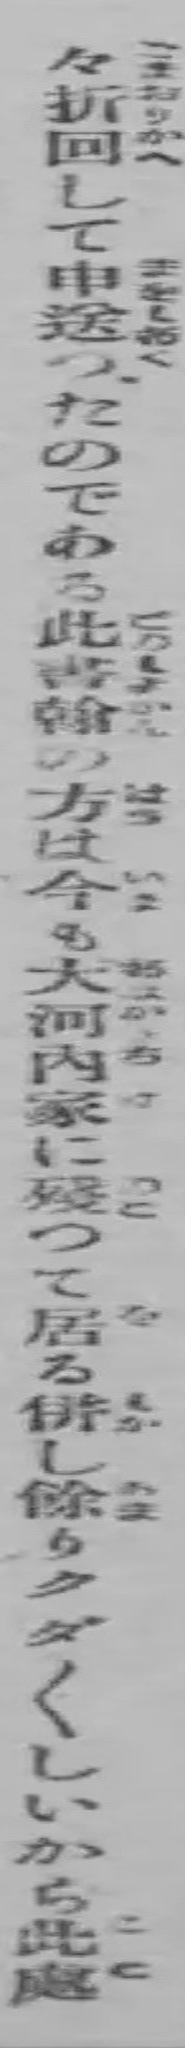細折回して申送つたのである此書翰の方は今も大河内家に残つて居る併し余りクダ〳〵しいから此処
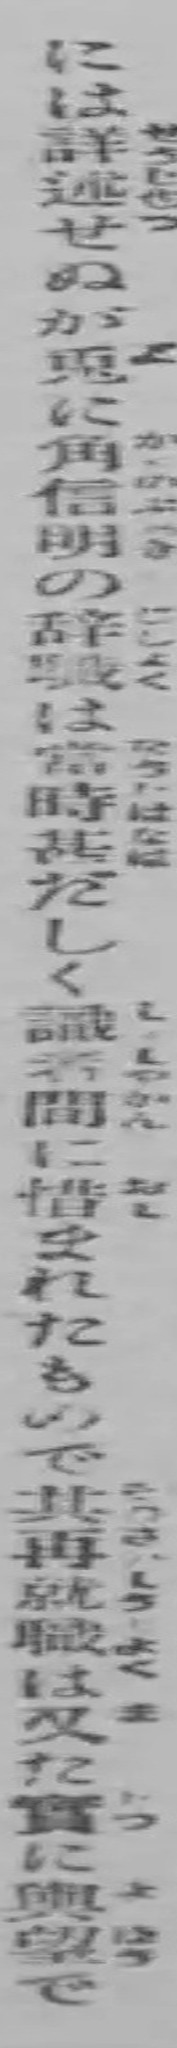には詳述せぬが兎に角信明の辞職は当時甚だしく識者間に惜まれたもので其再就職は又た実に輿望で
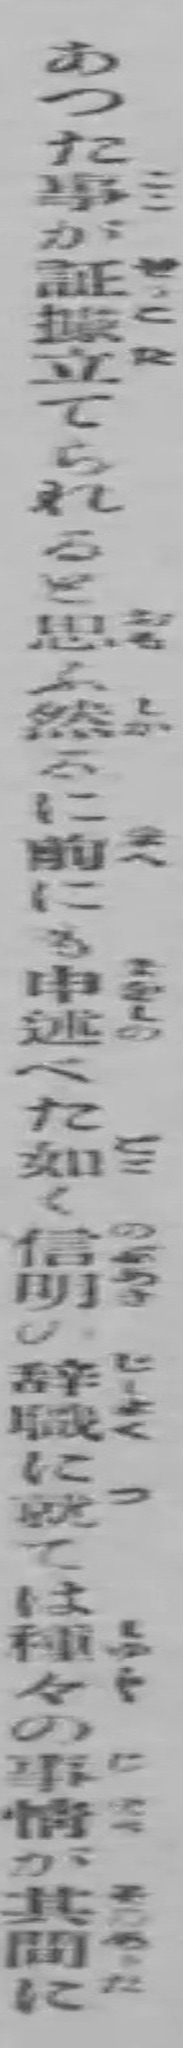あつた事が証拠立てられると思ふ然るに前にも申述べた如く信明の辞職に就ては種々の事情が其間に
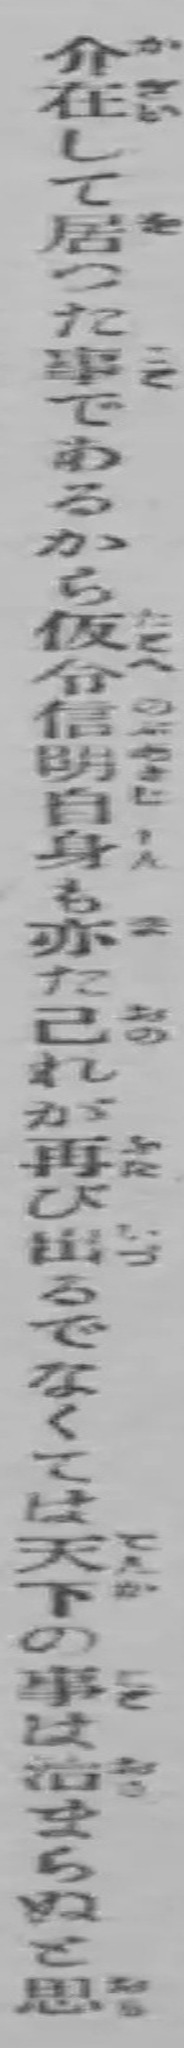介在して居つた事であるから仮令信明自身も亦た己れが再び出るでなくては天下の事は治まらぬと思
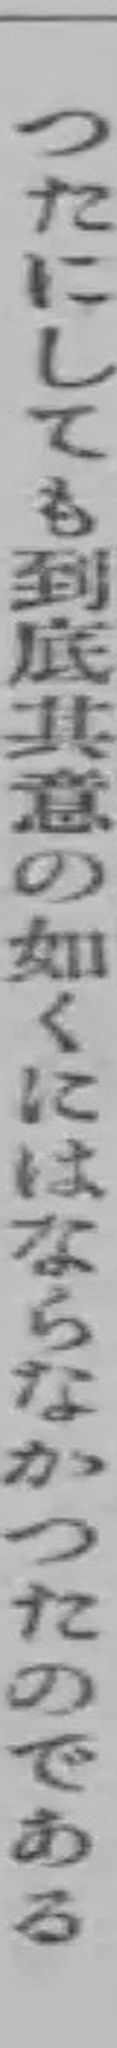つたにしても到底其意の如くにはならなかつたのである
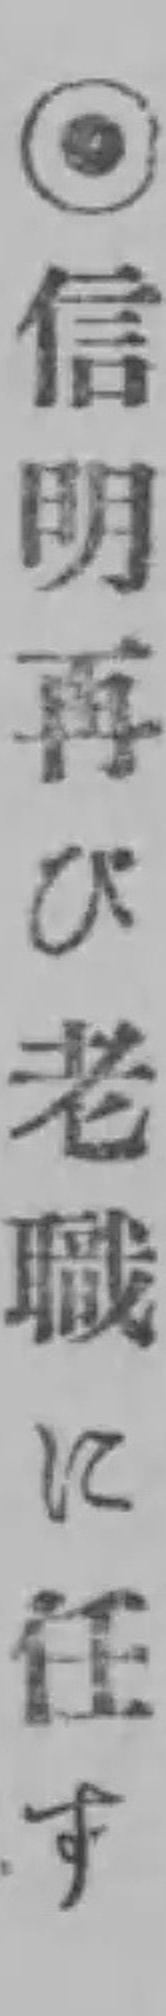⦿信明再び老職に任ず
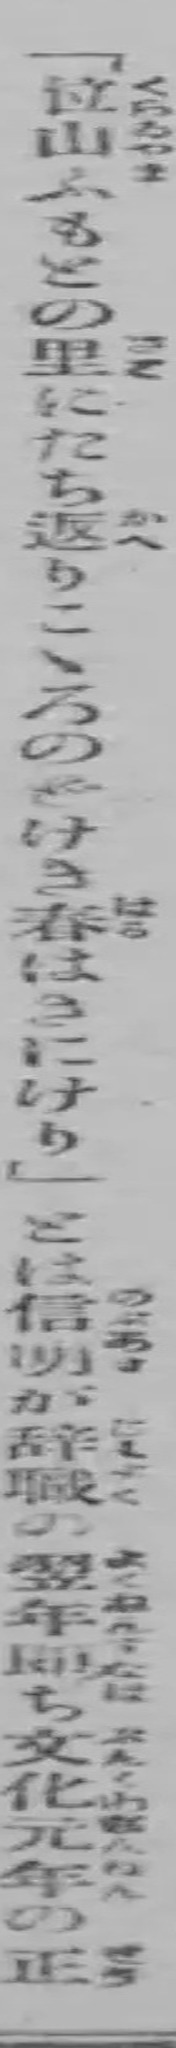信明と和歌「位山ふもとの里にたち返りこゝろのどけき春はきにけり」とは信明が辞職の翌年即ち文化元年の正
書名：豊橋市史談
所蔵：国立国会図書館 National Diet Library, JAPAN
